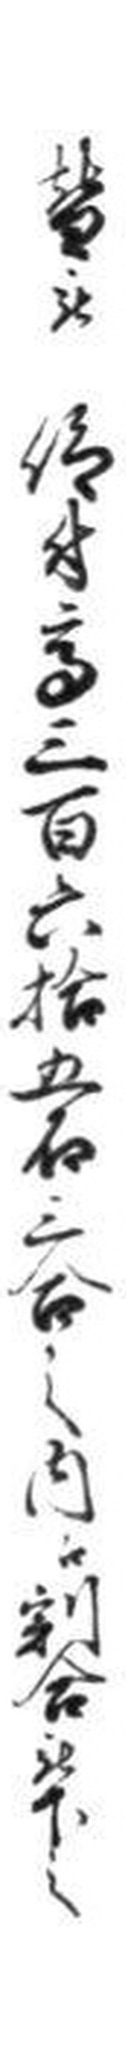替被仰付高三百六拾五石三合之内江割合被下之
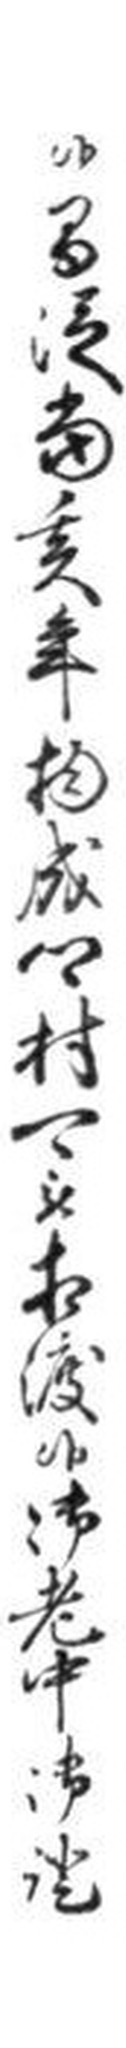候間従当亥年物成郷村可被相渡候御老中御証
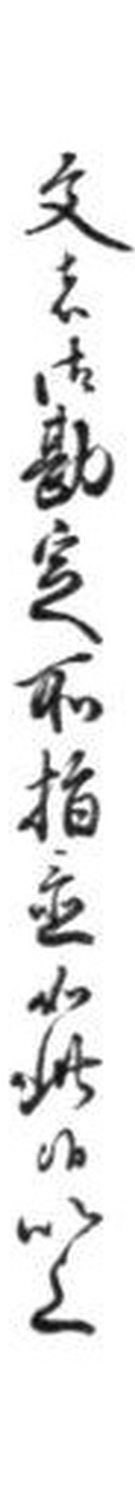文者御勘定所指置如此候以上
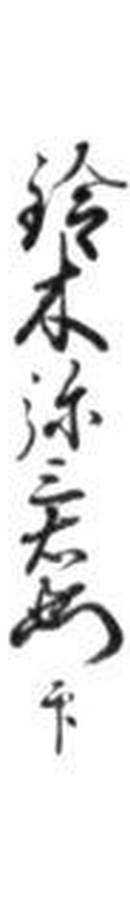正木藤右衛門印
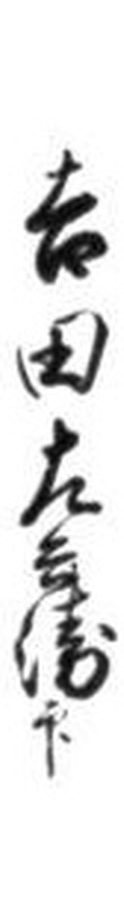吉田左兵衛印
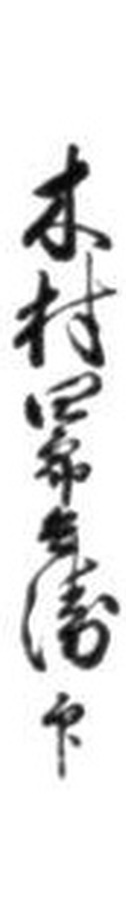木村四郎兵衛印
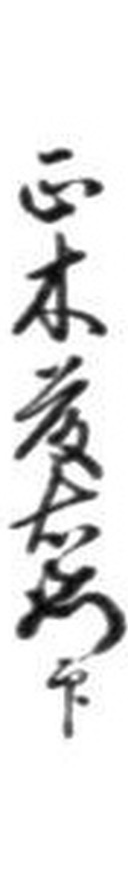正木藤右衛門印
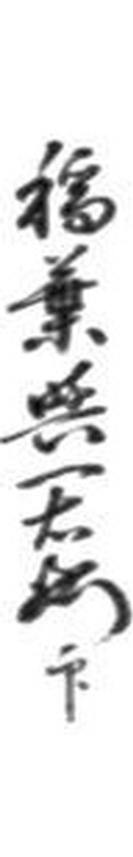稲葉与一右衛門印
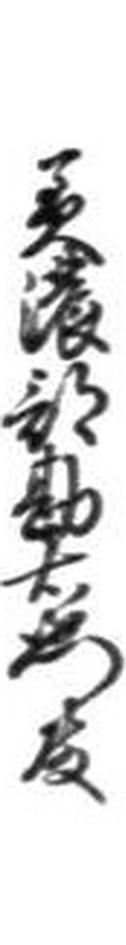美濃部勘右衛門殿
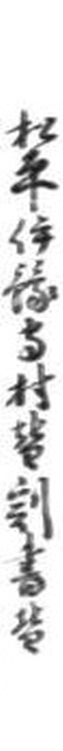松平伊予守村替割書替
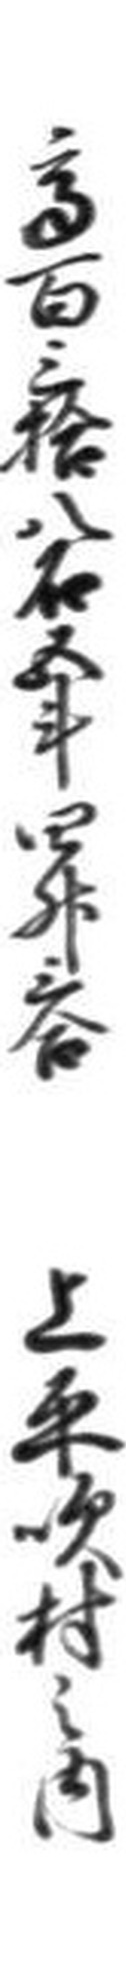高百三拾八石五斗四升三合上平吹村之内

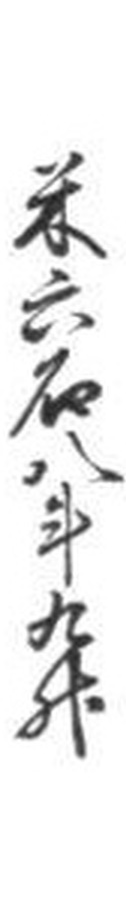米六石八斗九升夫米
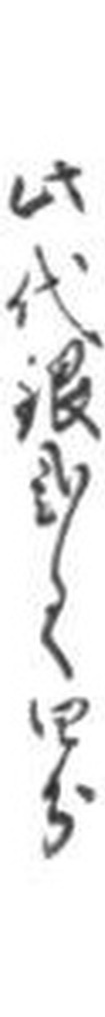此代銀弐匁四分
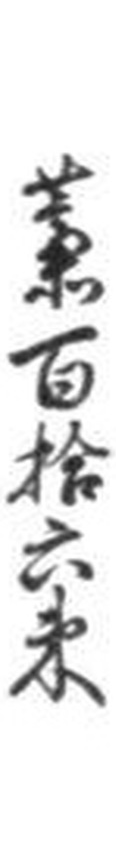藁百拾六束
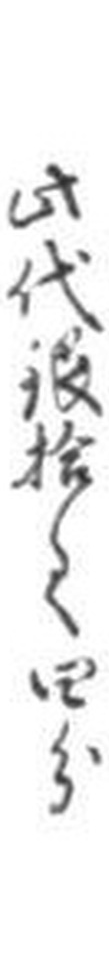此代銀拾匁四分
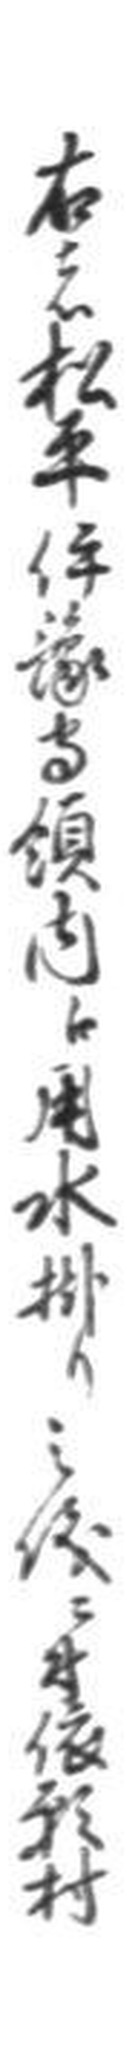右者松平伊予守領内江用水掛り之儀ニ付依願村
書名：家譜 三十三 吉邦公 享保四年
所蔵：福井県文書館 Fukui Prefectural Archives
